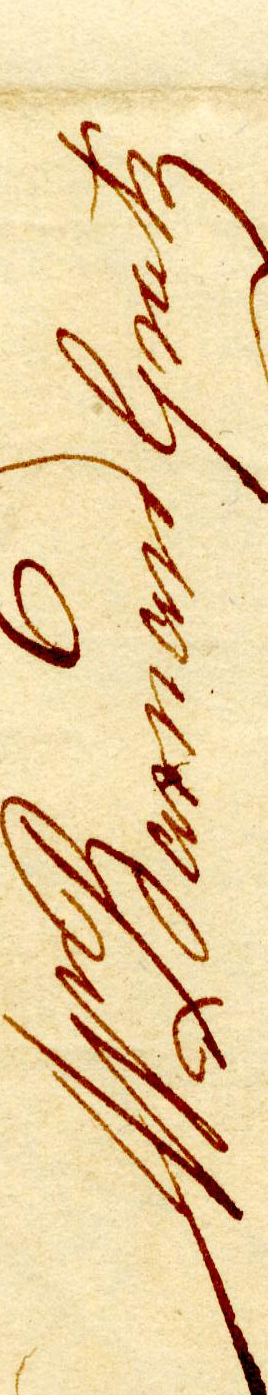M^r Barnard Gratz
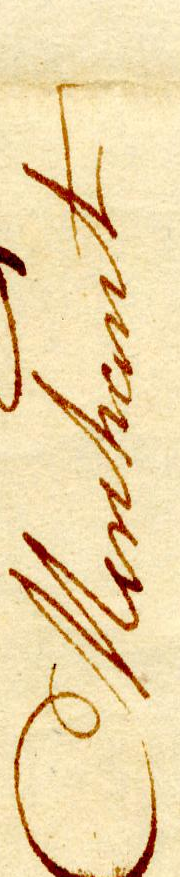Merchant
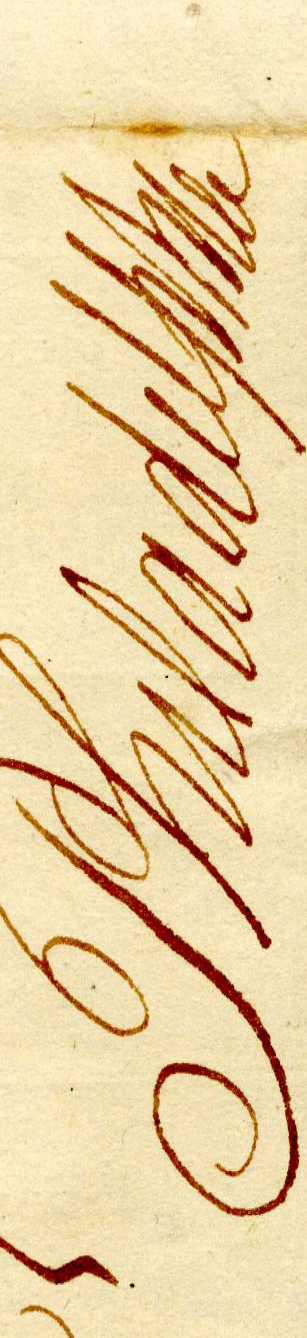Philadelphia
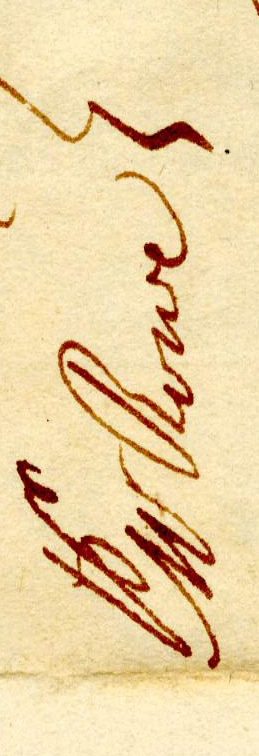Per M^r Rowe
